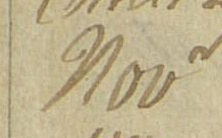Nov^r
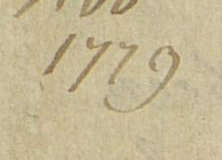1779
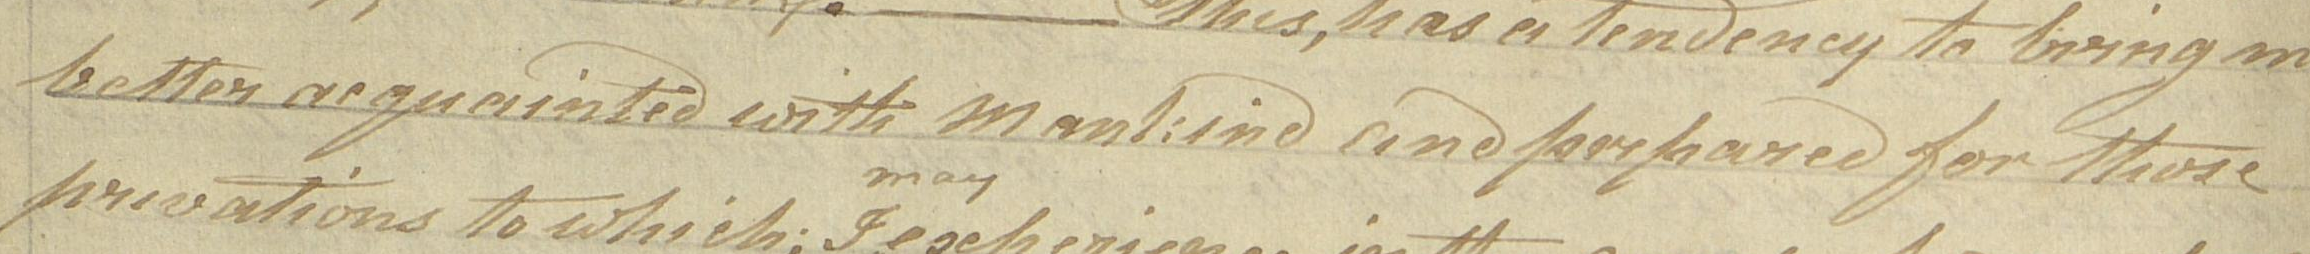better acquainted with mankind and prepared for those
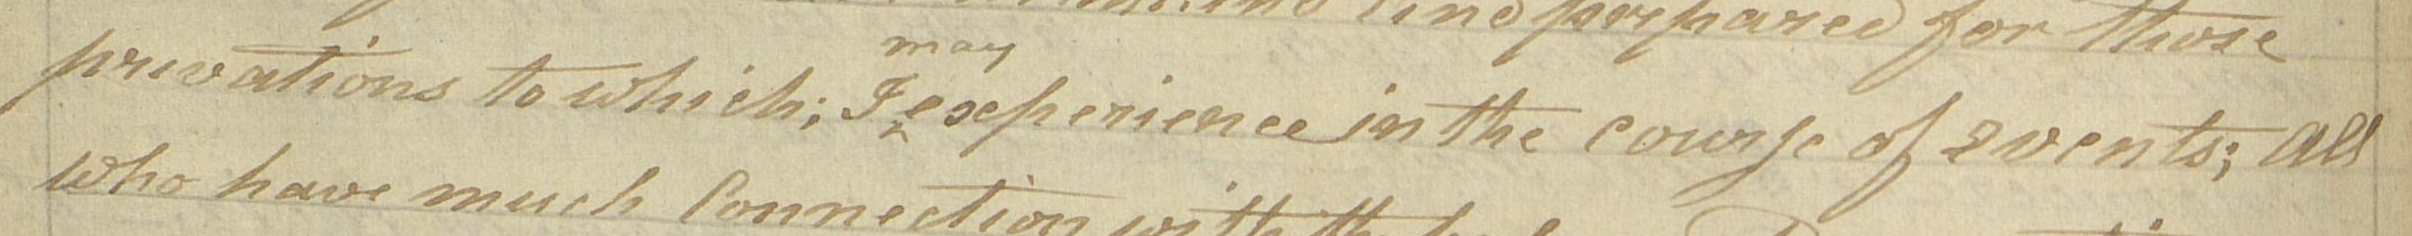privations to which; I ^ experience in the course of events; all
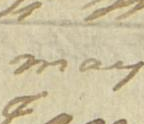may
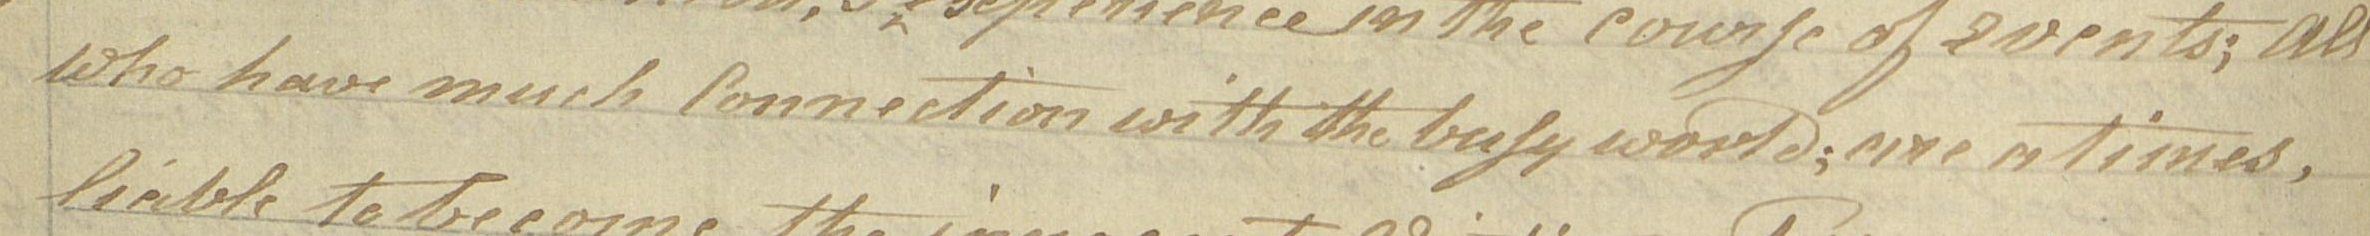who have much connection with the busy world; are a times,
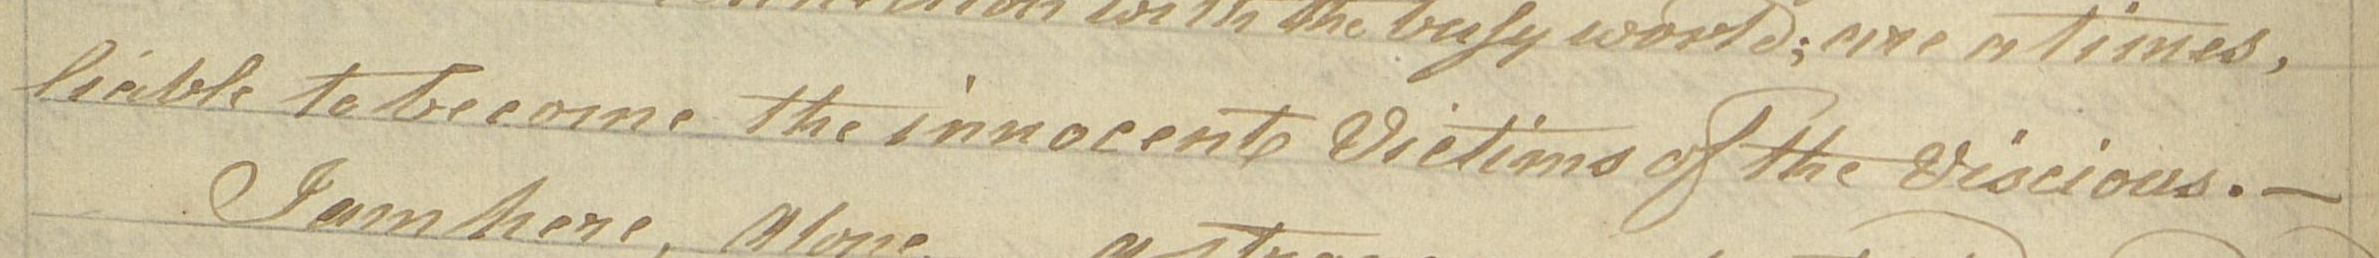liable to become the innocent Victims of the Viscious.
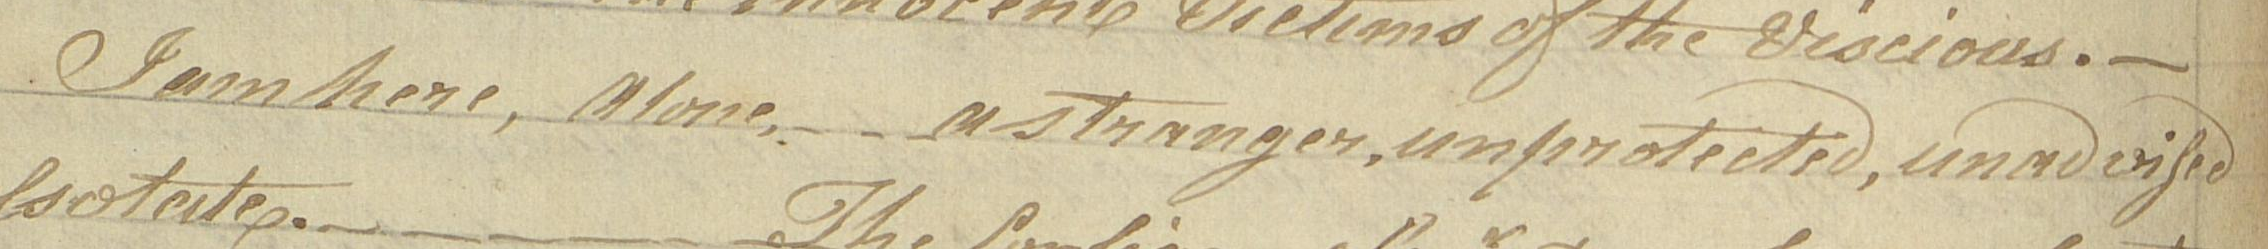I am here, Alone, a stranger, unprotected, unadvised
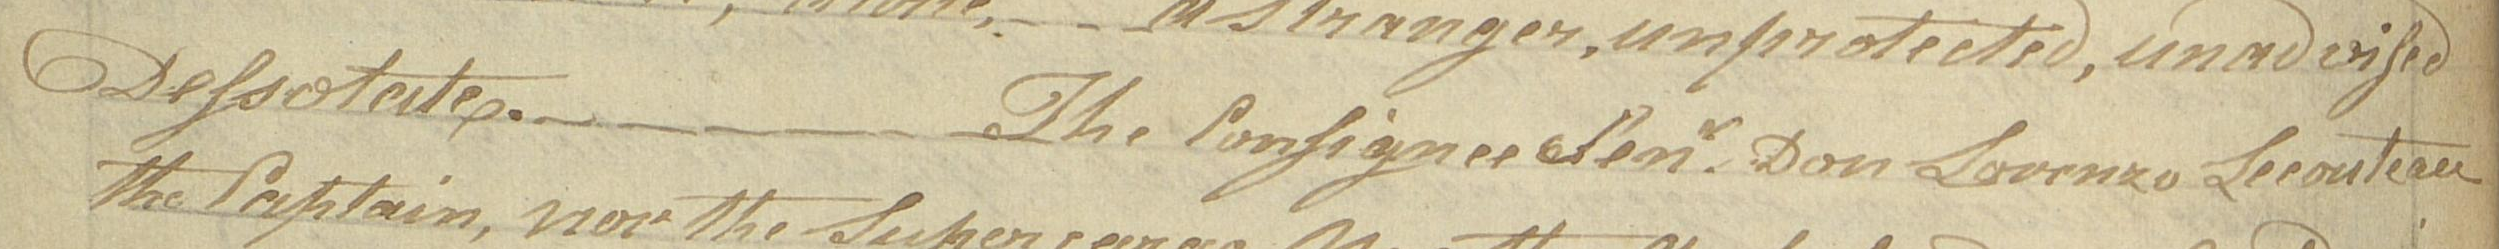Dessolate. The Consignee Sen^r. Don Lorenzo Lecouteau
